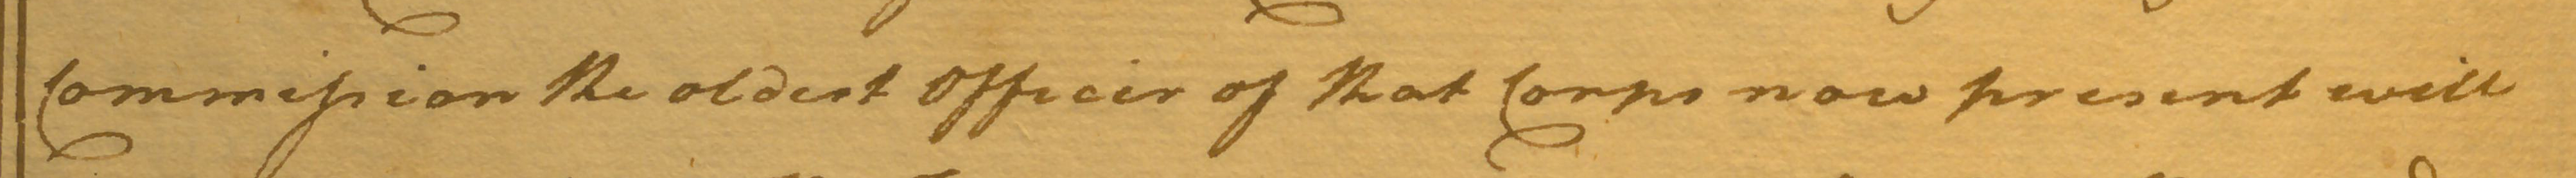Commission the oldest officer of that Corps now present will
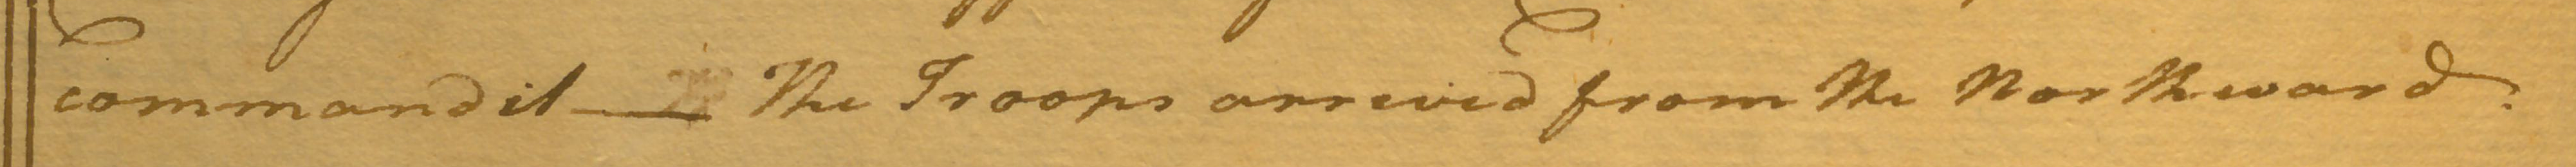command it- The Troops arrived from the Northward
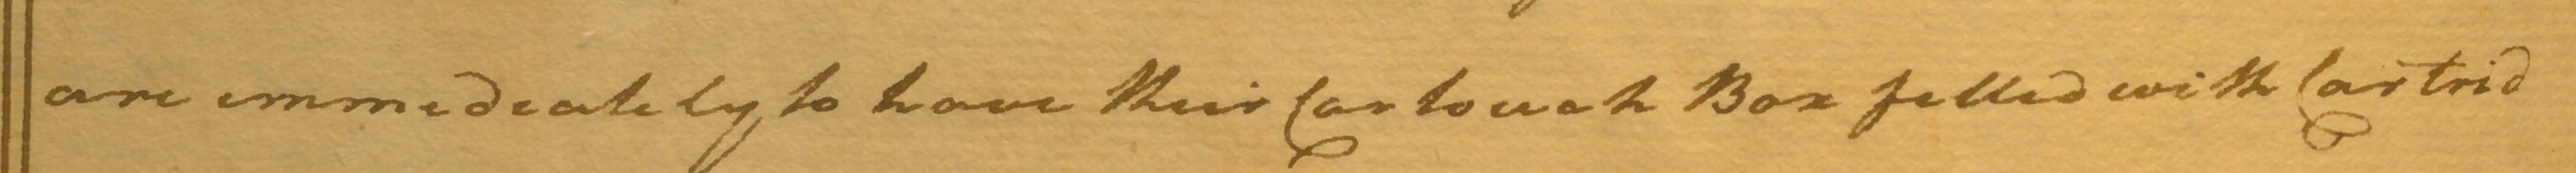are immedeately to have their Cartouch Box filled with Cartrid
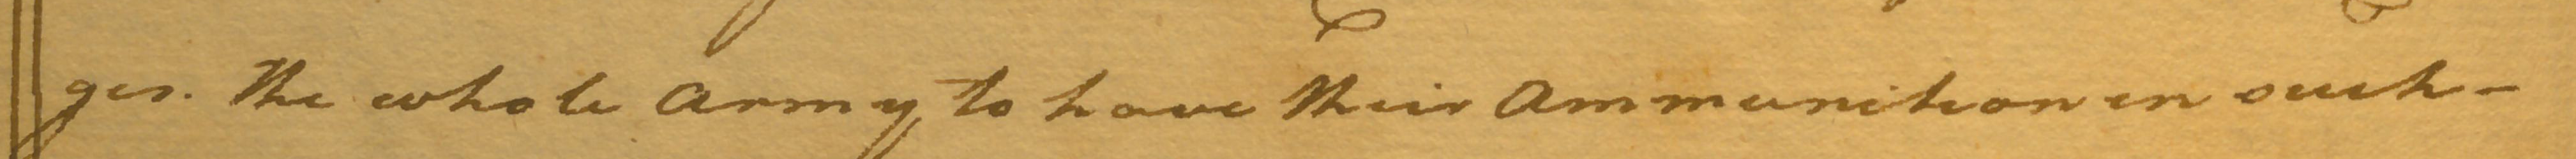ges. The whole Army to have their Ammunition in such-
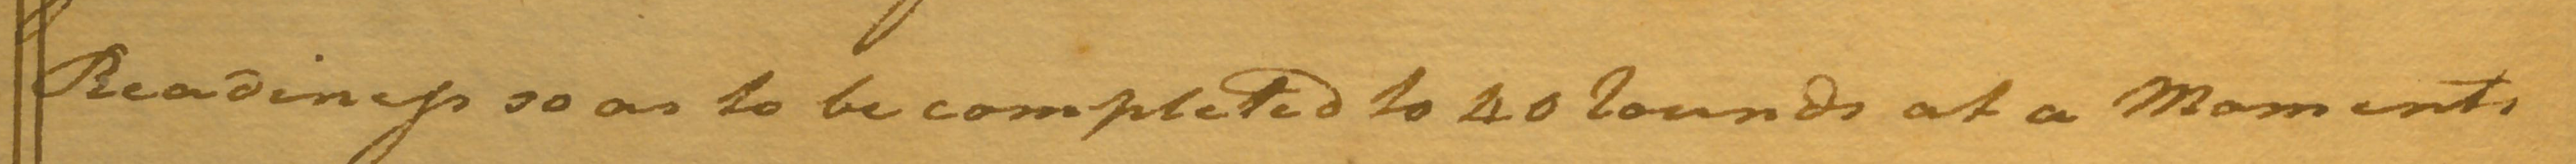Readiness so as to be completed to 40 rounds at a Moments
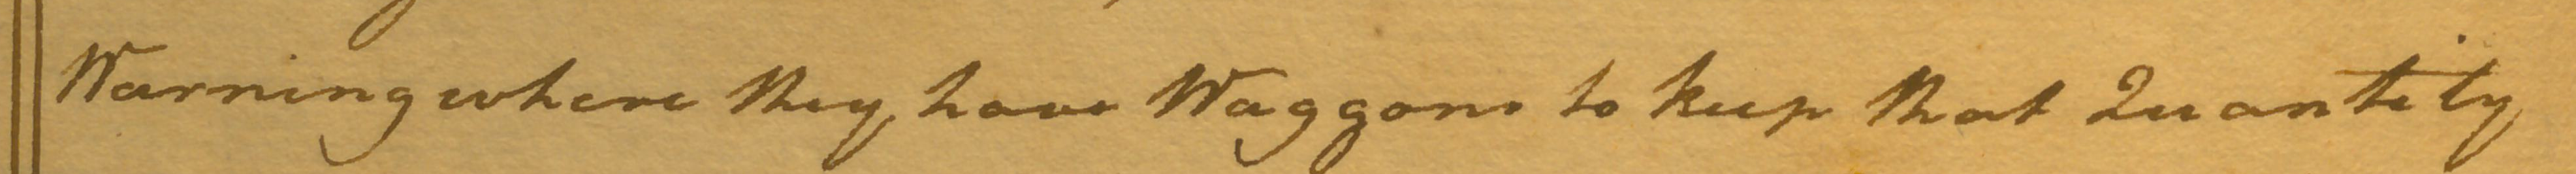Warning where they have Waggons to keep that Quantity
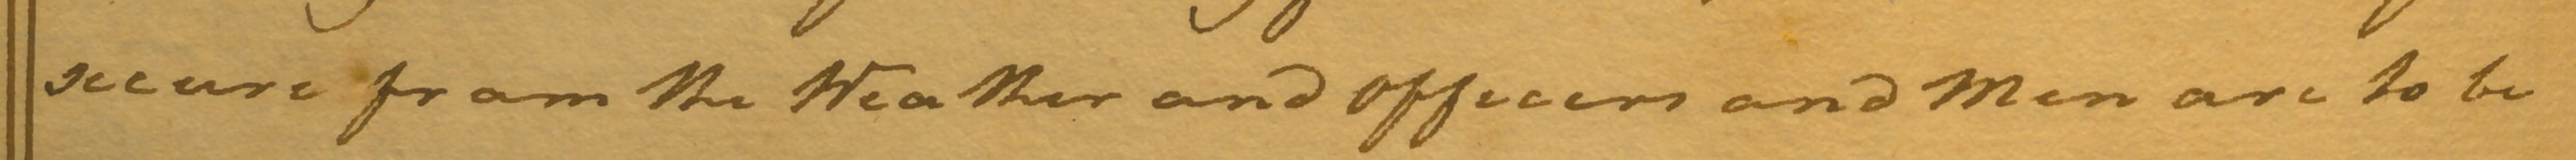secure from the Weather and Officers and Men are to be
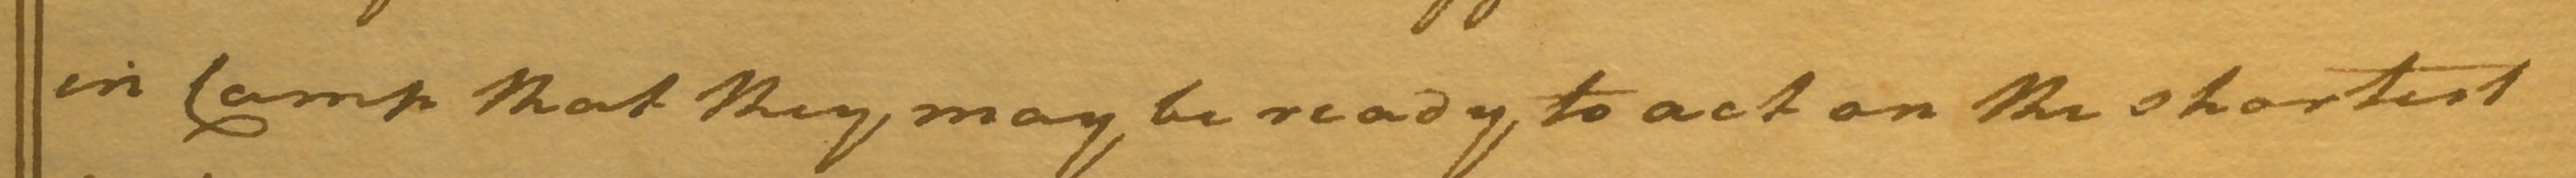in Camp that they may be ready to act on the shortest
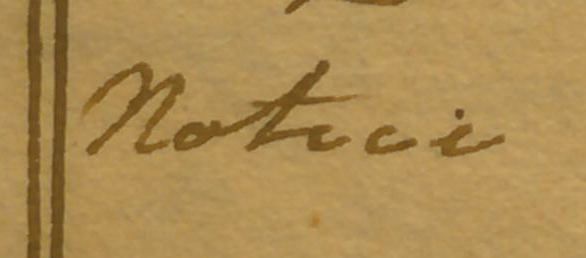Notice
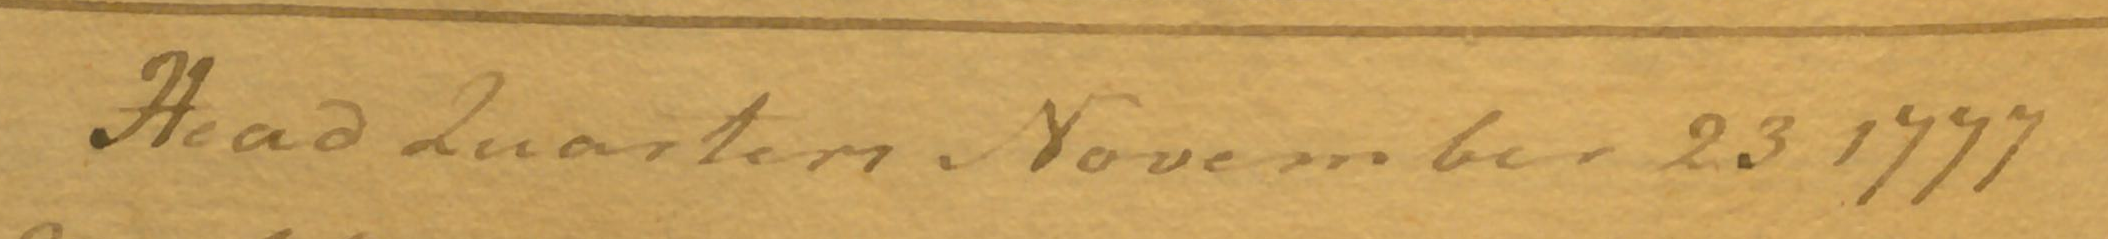Head Quarters November 23 1777
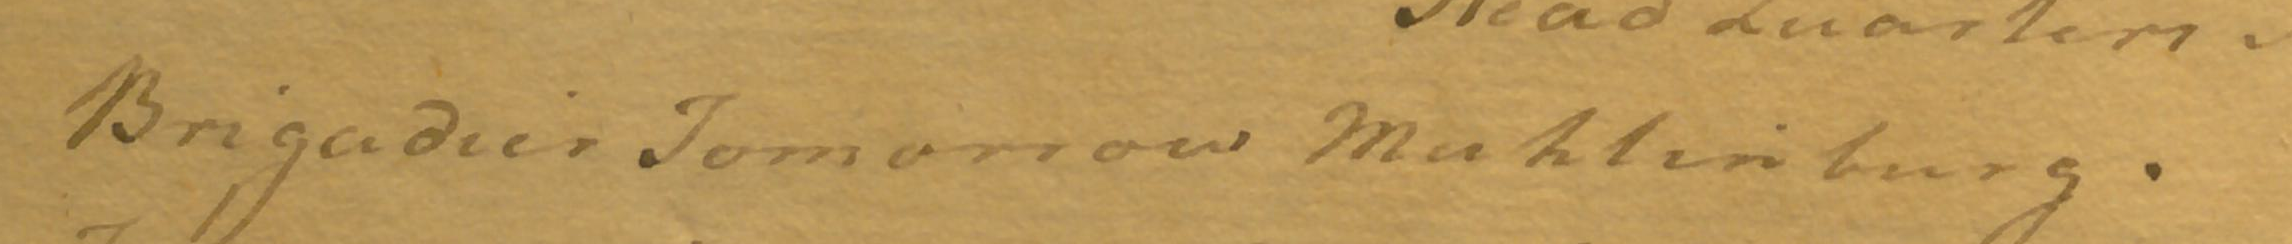Brigadier Tomorrow Muhlinburg.
